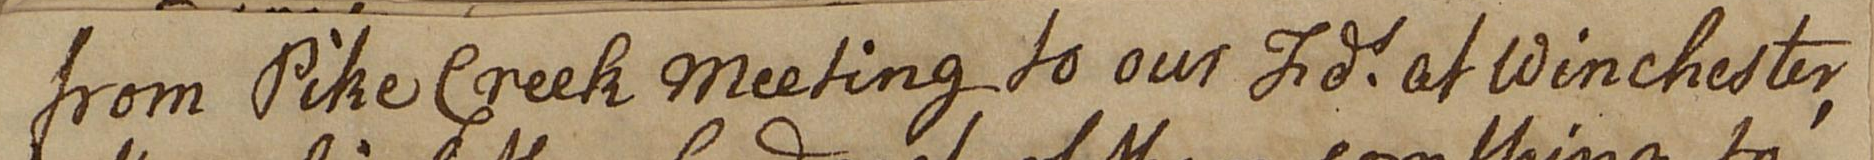from Pike Creek meeting to our Fd^s. at Winchester,
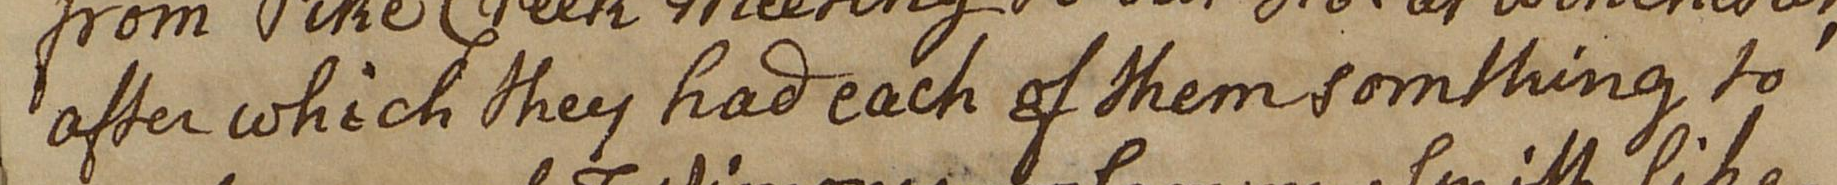after which they had each of them somthing to
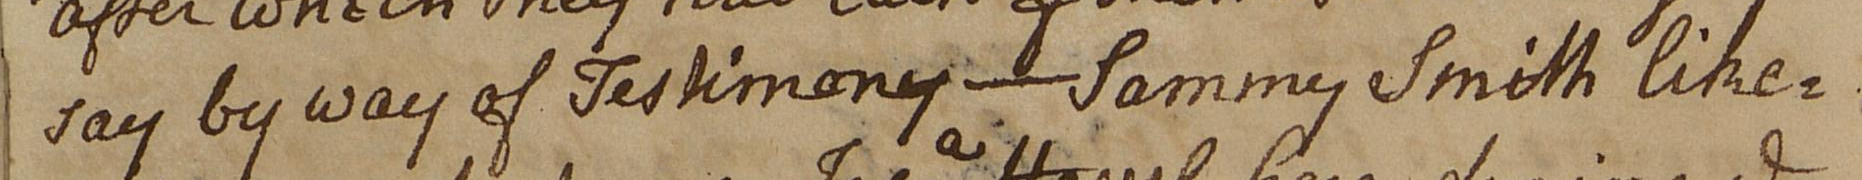say by way of Testimony- Sammy Smith like-
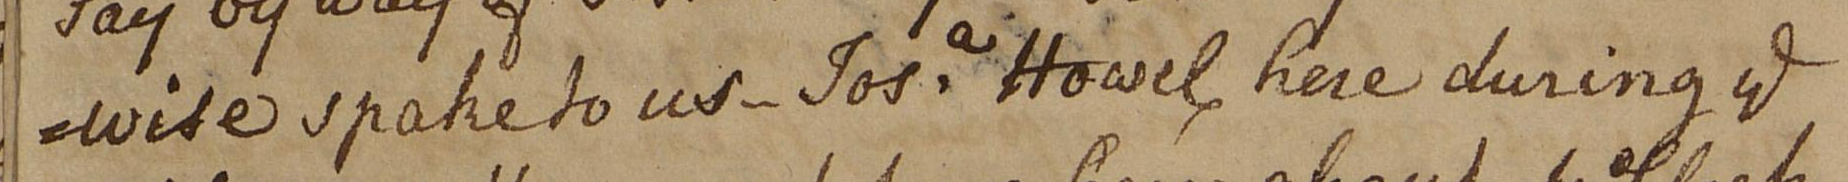-wise spoke to us- Jos^a. Howel here during y^e
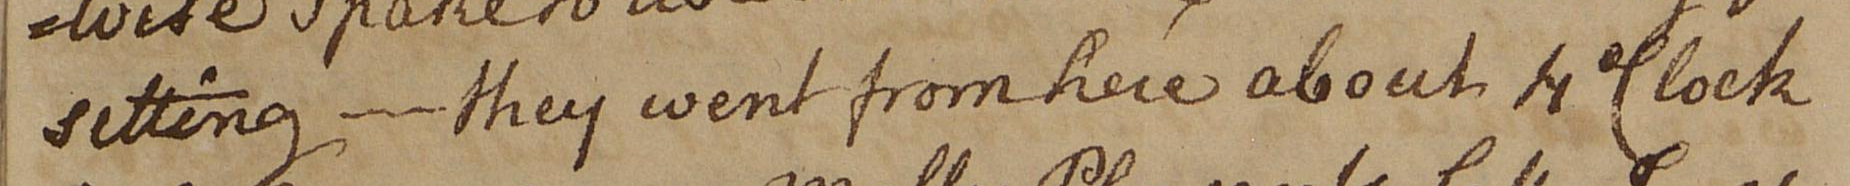sitting- they went from here about 4 ^o Clock
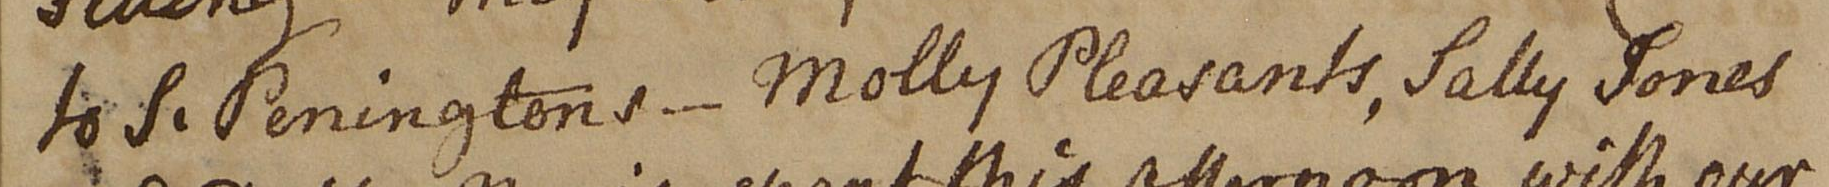to S. Peningtons- Molly Pleasants, Sally Jones
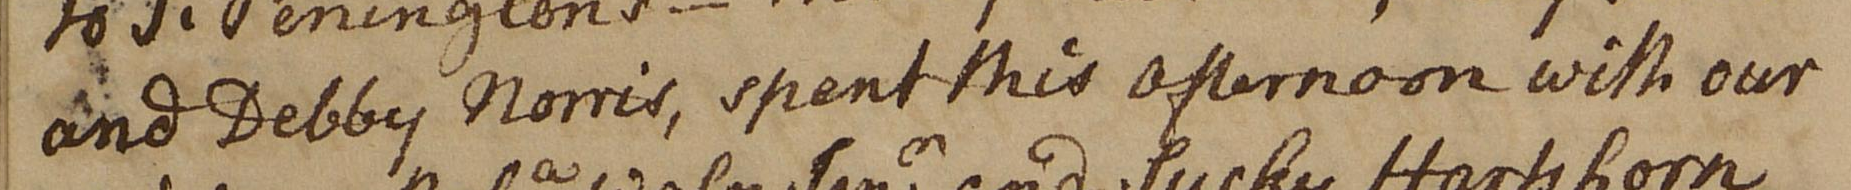and Debby Norris, spent this Afternoon with our
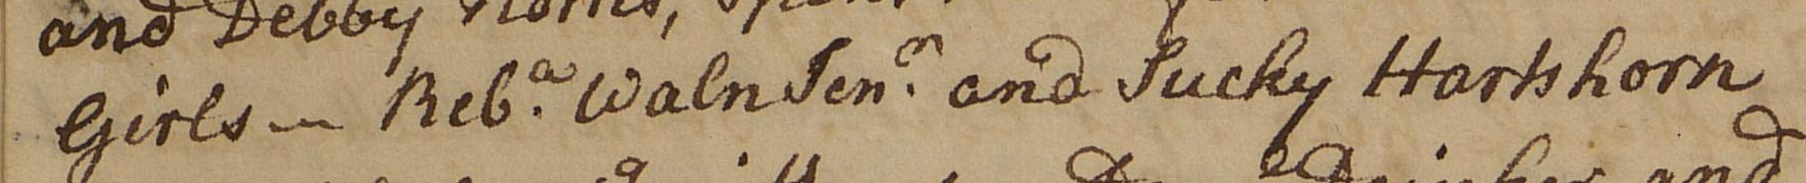Girls- Reb^a. Waln Sen^r. and Sucky Hartshorn
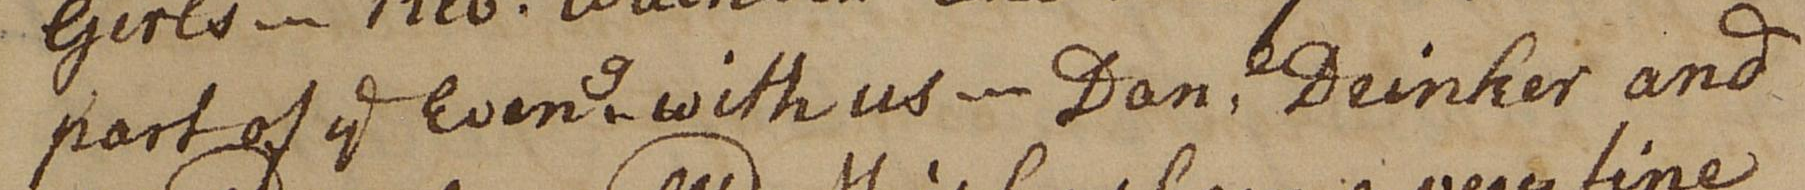part of y^e Even^g. with us- Dan^l. Drinker and
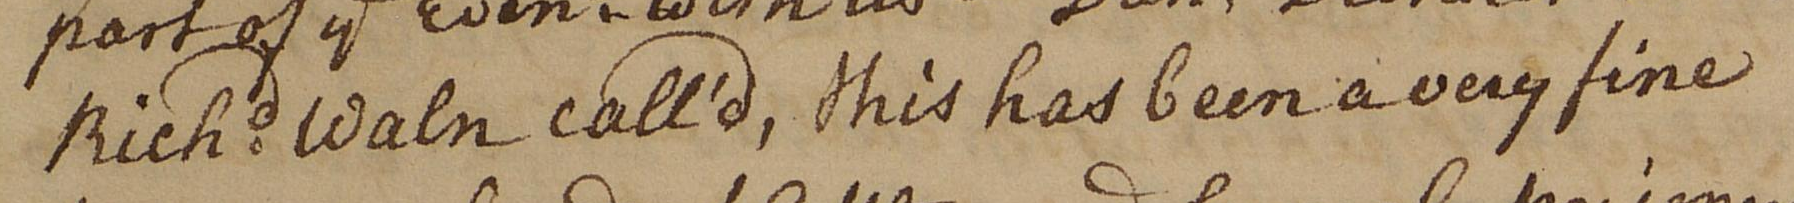Rich^d. Waln call'd, this has been a very fine
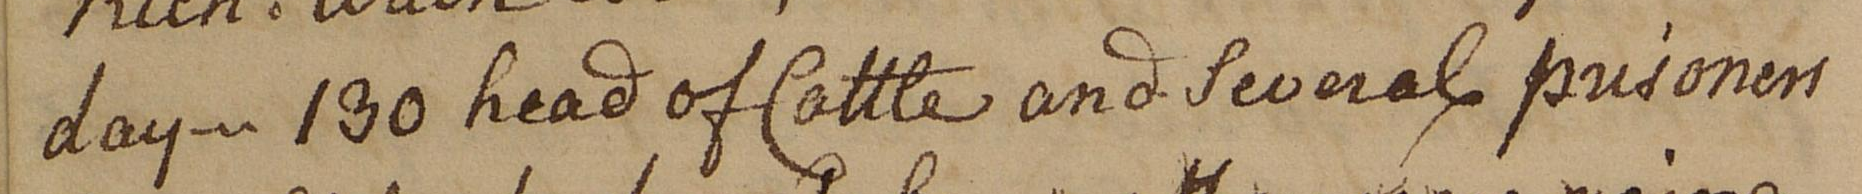day- 130 head of Cattle and Several prisoners
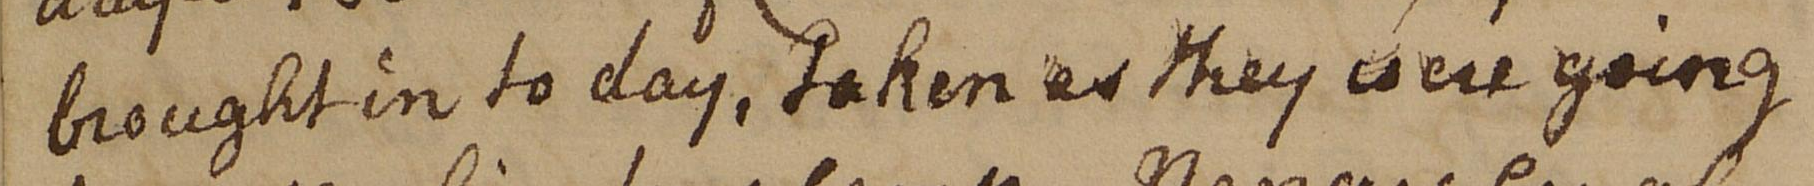brought in to day. Taken as they were going
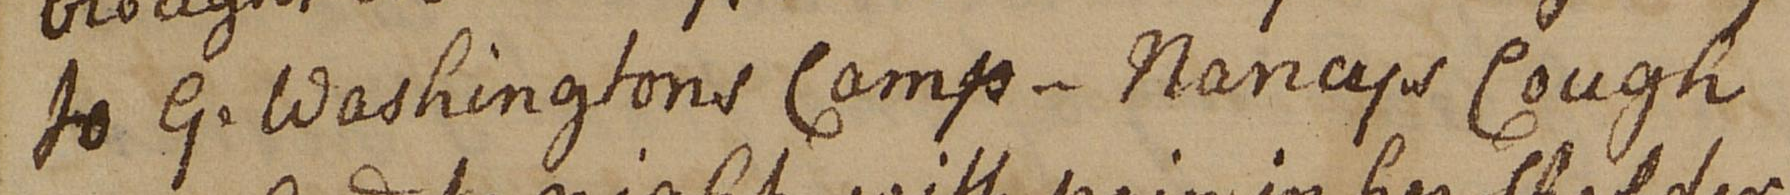to G. Washingtons Camp- Nancys Cough
